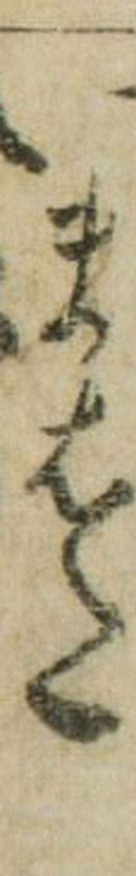いまはた
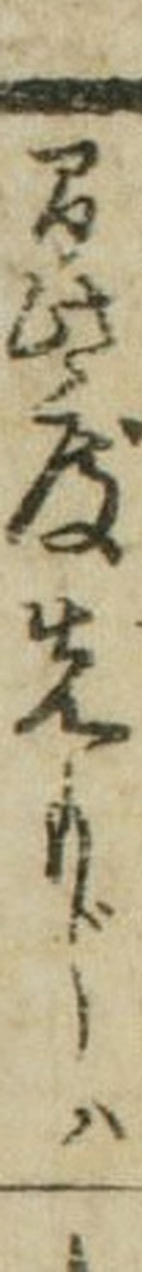間此度先もじは
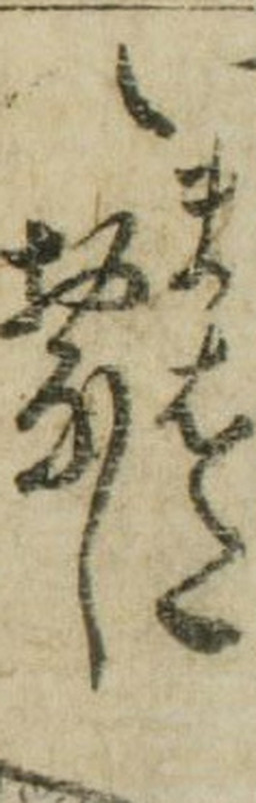おなし
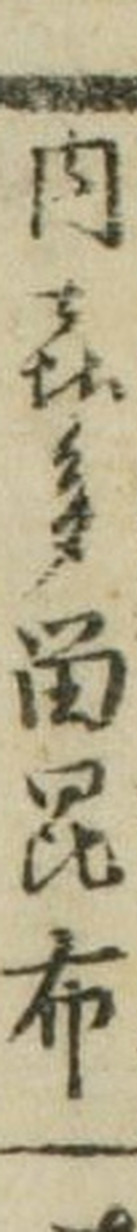内喜多留昆布
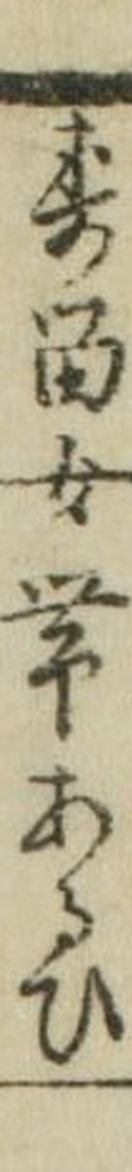寿留女帯あるひ
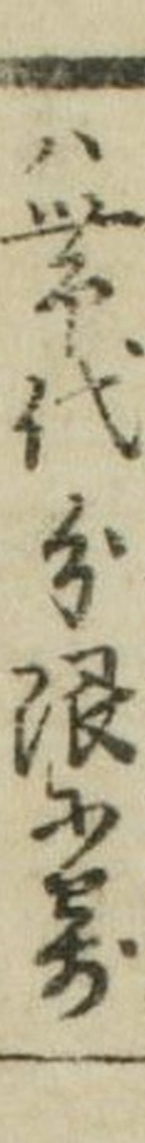は帯代分限に寄
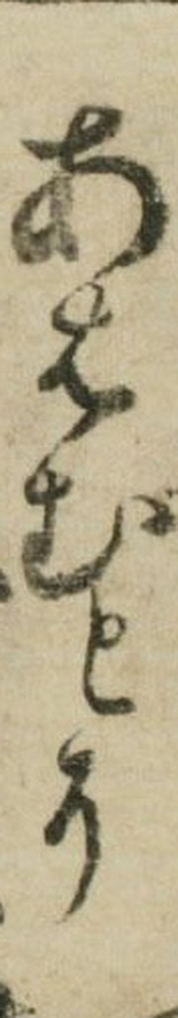あはむとそ
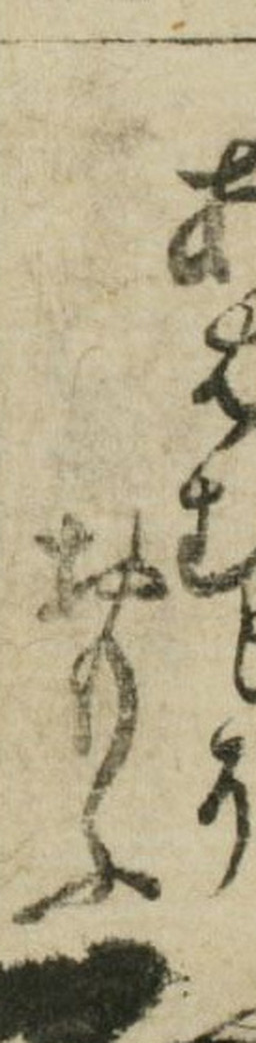おもふ
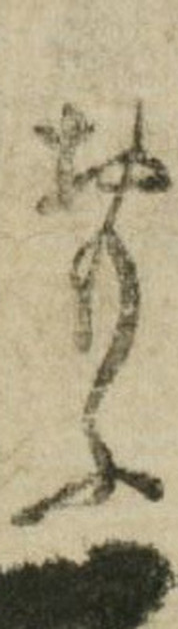おもふ
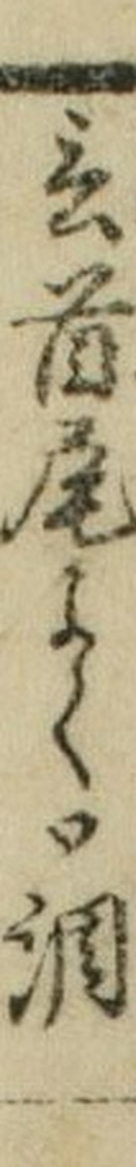言首尾よく御調
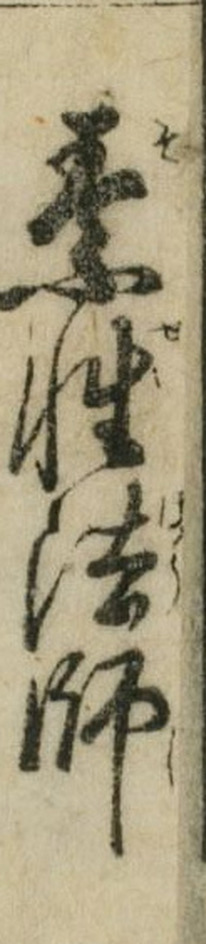素性法師
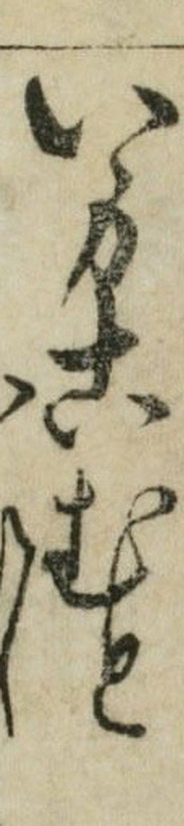いまこむと
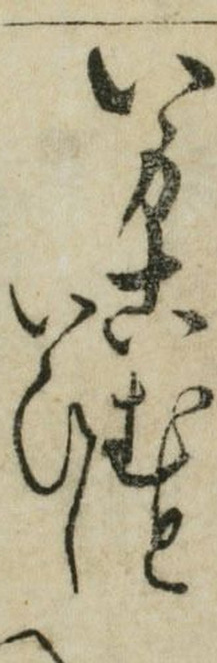いひし
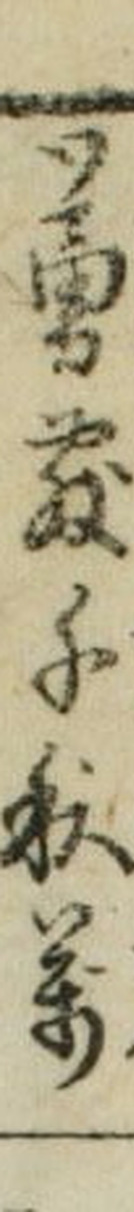御勇敷千秋万
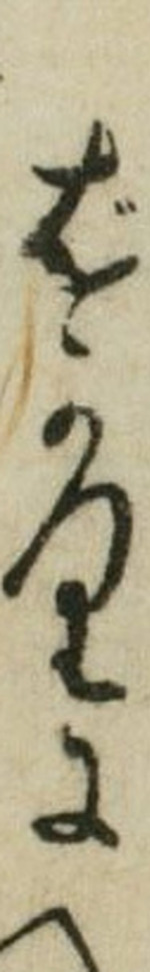ばかりに
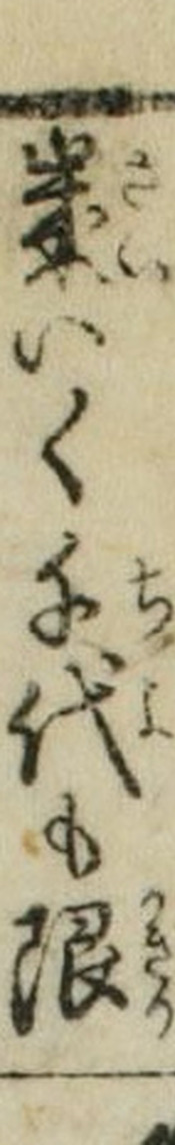歳いく千代も限
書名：百人一首
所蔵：東京学芸大学教育コンテンツアーカイブ
